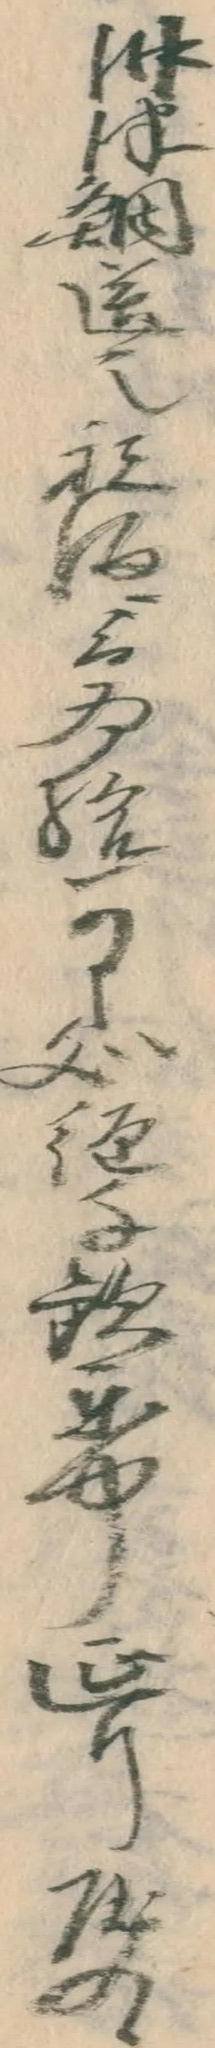時津鯛送也祝酒ニ而為給可申処経千歓楽中延引屋のゝ
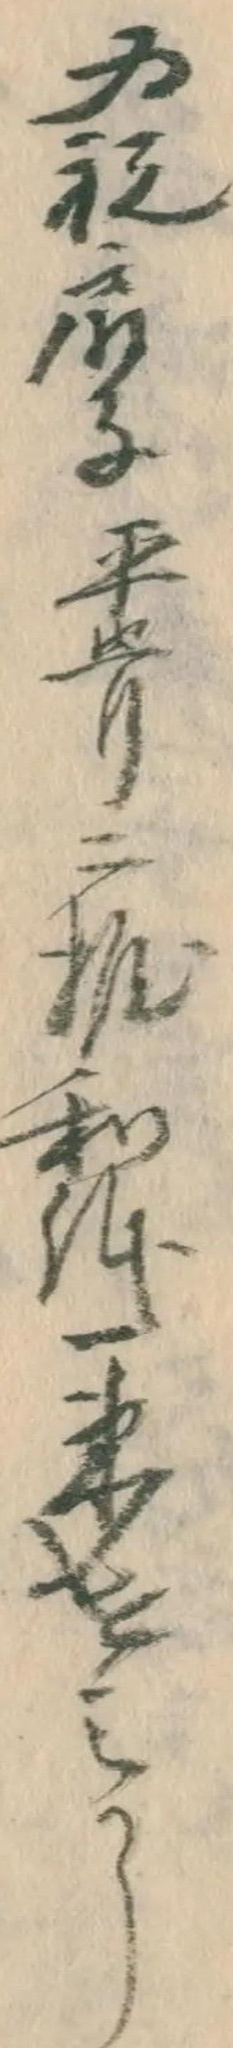為祝扇子平骨二握和紙一束遣之了
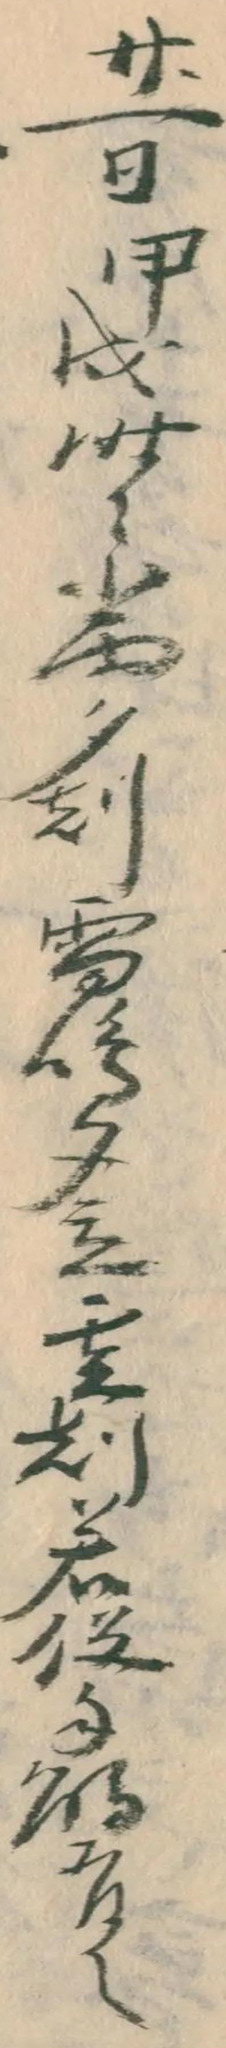廿一日甲戌時々小雨夕刻雷鳴夕立亥刻若役手觸有之
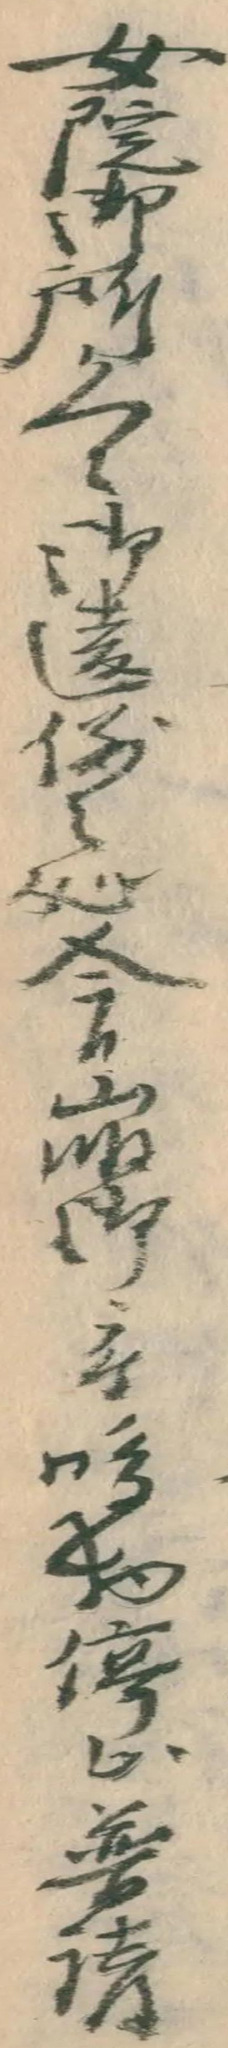女院御所久々御違例之処今日崩御ニ付鳴物停止普請

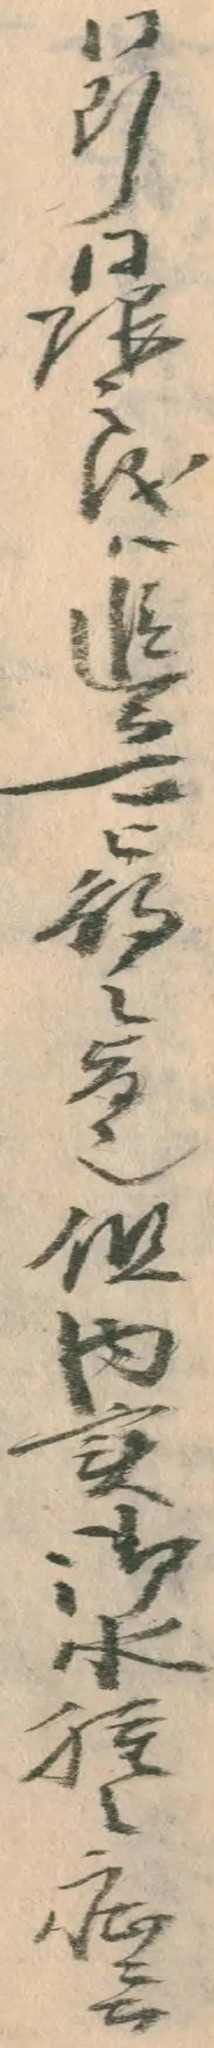同断日限之儀ハ追而可被觸之旨也但内実御水腫之症ニ而
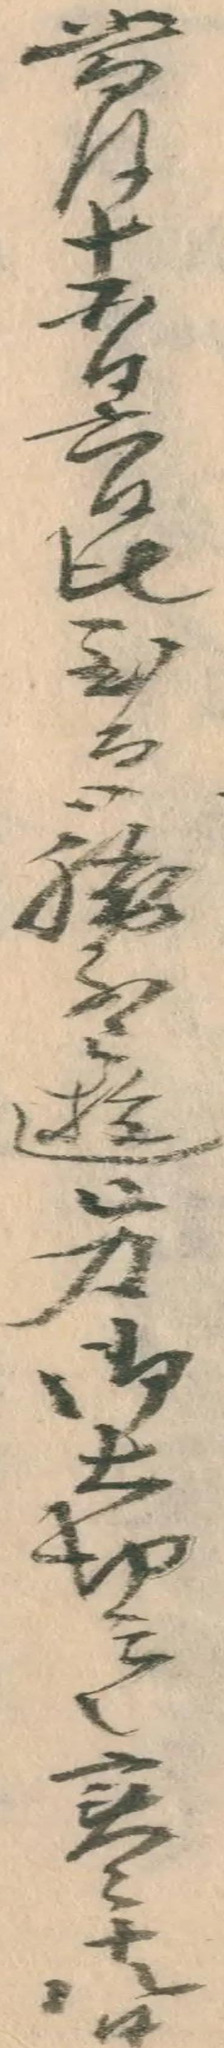當月十五日六日比至而御勝不被遊被及御大切云々実ニ十八日
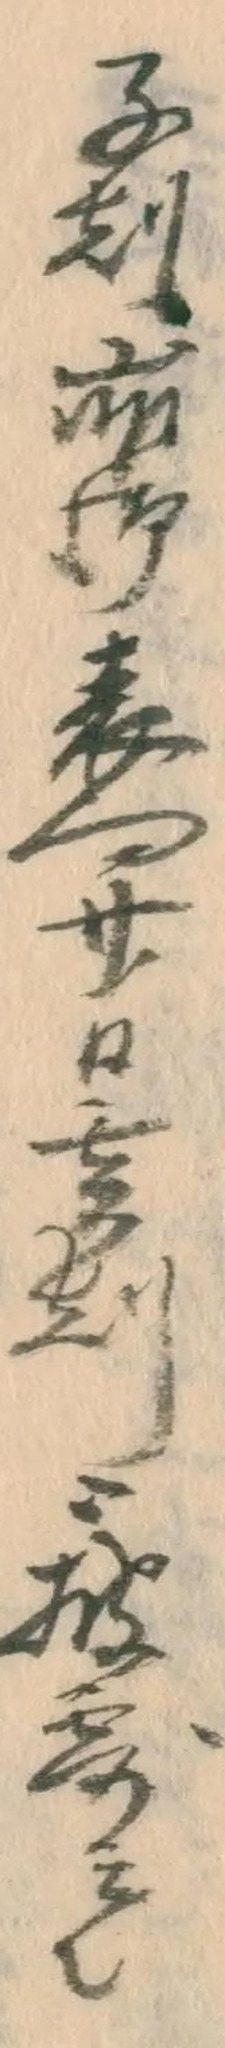子刻崩御表向廿日亥刻御披露云々
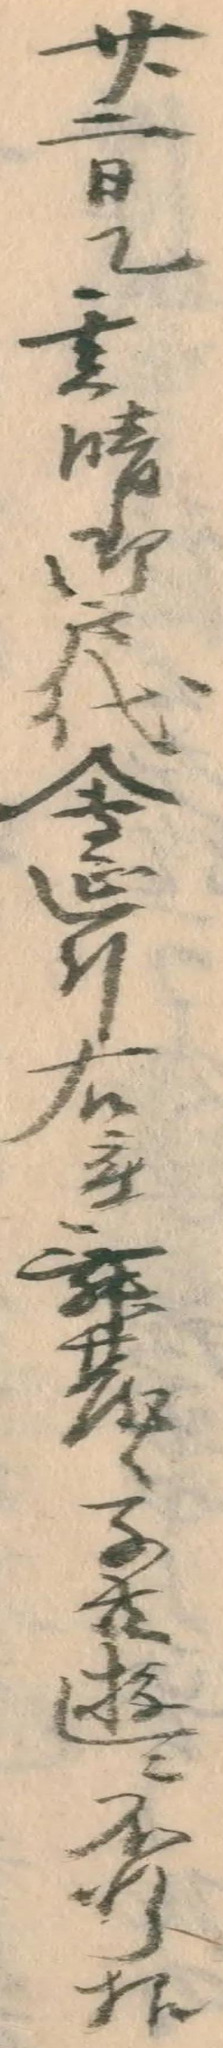廿二日乙亥晴御戸代會延引右ニ付舞䑓へ子共遊ニ不行様
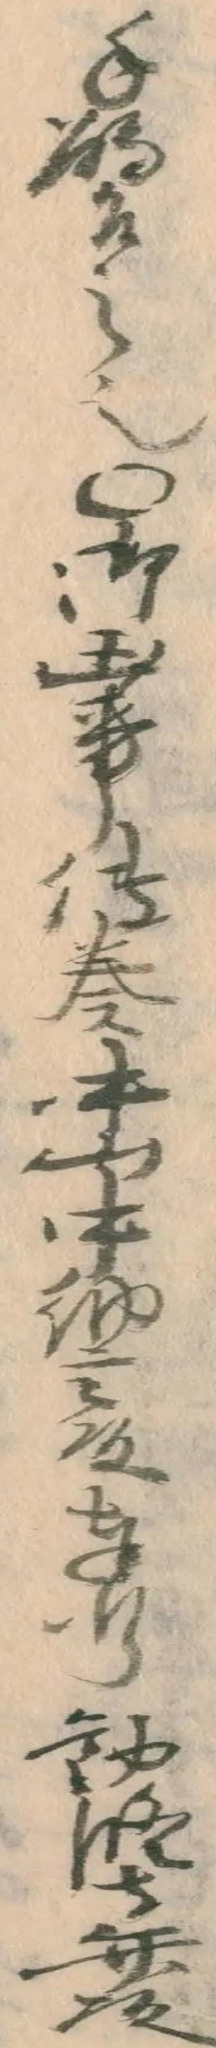手觸有之也○御凶事傳奏中山中納言殿奉行勧修寺弁殿
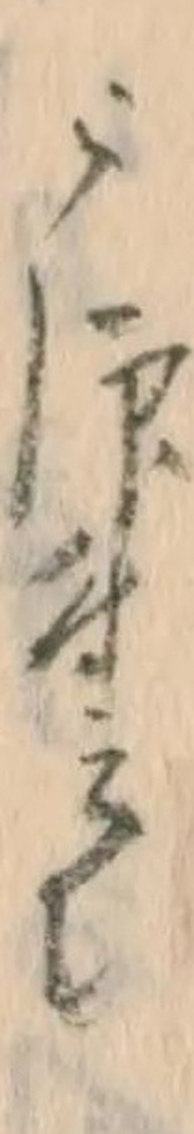被仰付云々
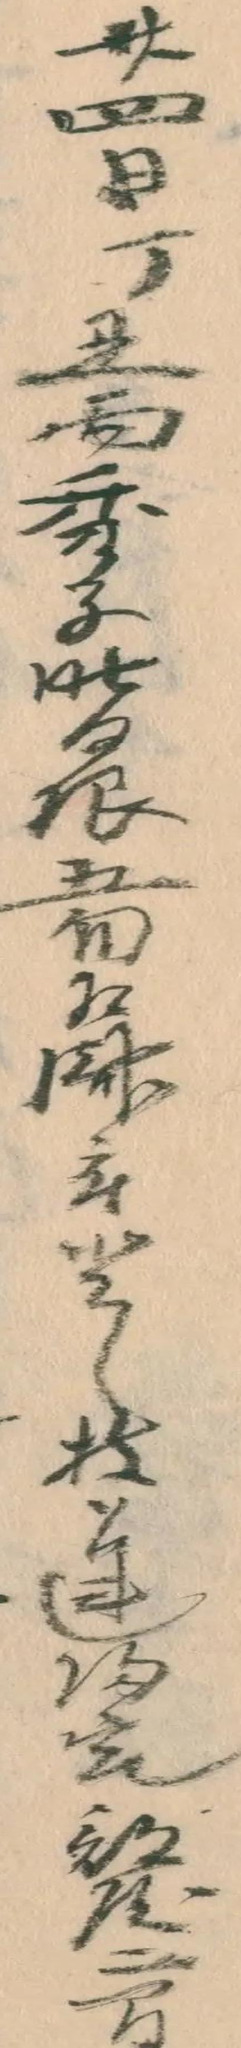廿四日丁丑雨秀子昨日限五旬相済ニ付とし枝召連帰宅部屋二間
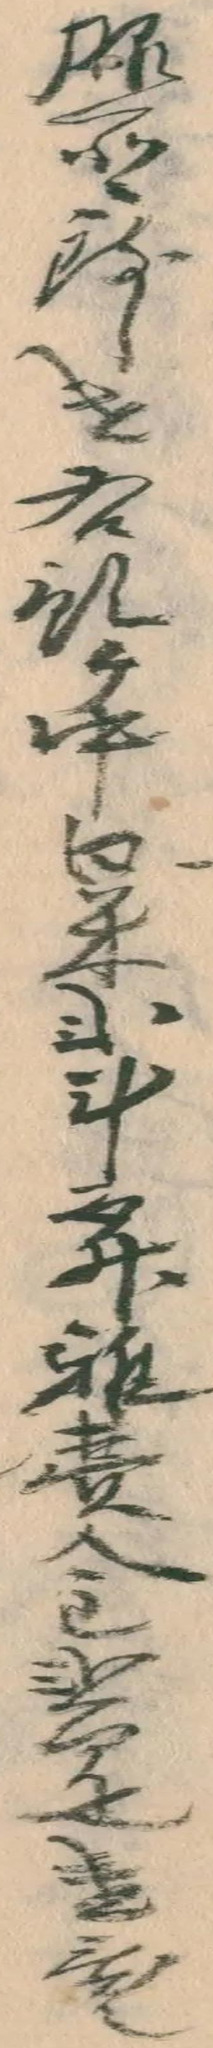服所へ致し遣右預ヶ中白米弐斗五升雑費金弐百疋遣置也
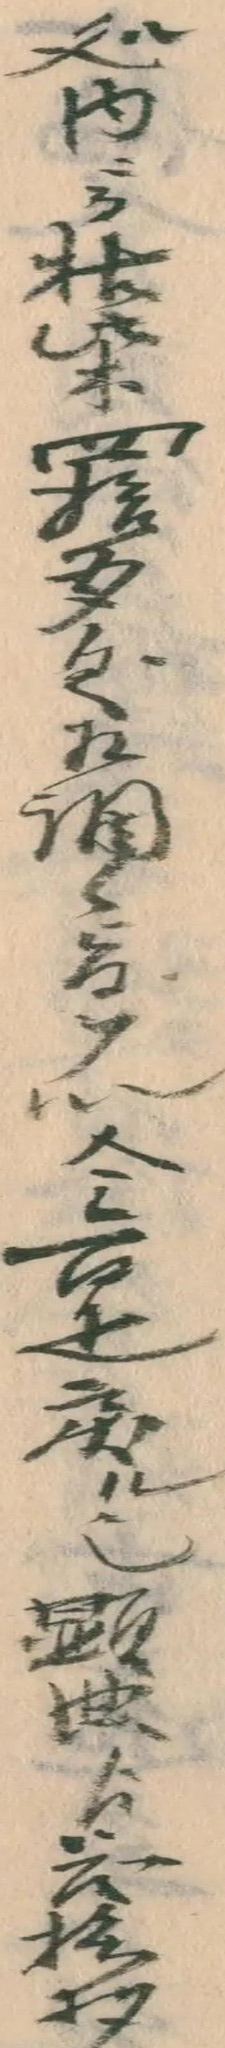処内ニ而枯柴四拾五匁相調候旨ヲ以金百疋戻ル也顕典ゟも挨拶
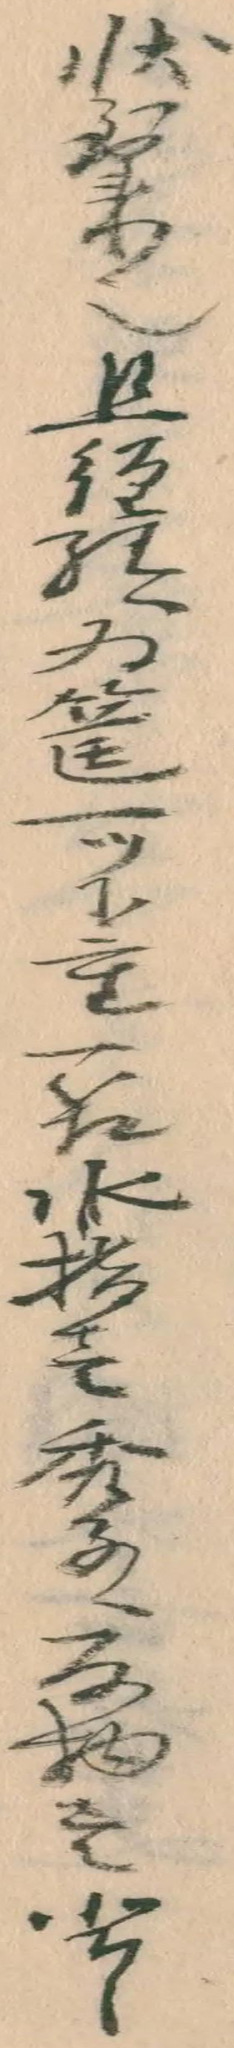状到来也且経紀へ為筐一ツ下重一箱水指壱秀子へ反物壱とし
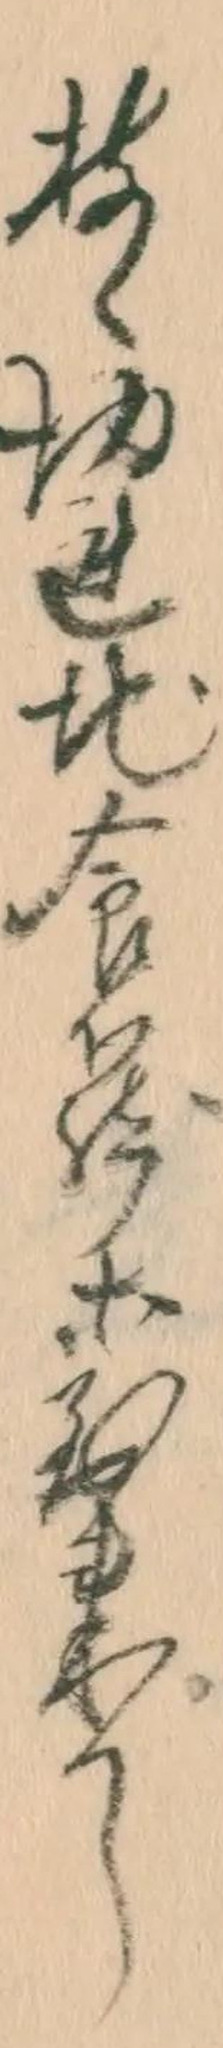枝へ切れ地食等到来也
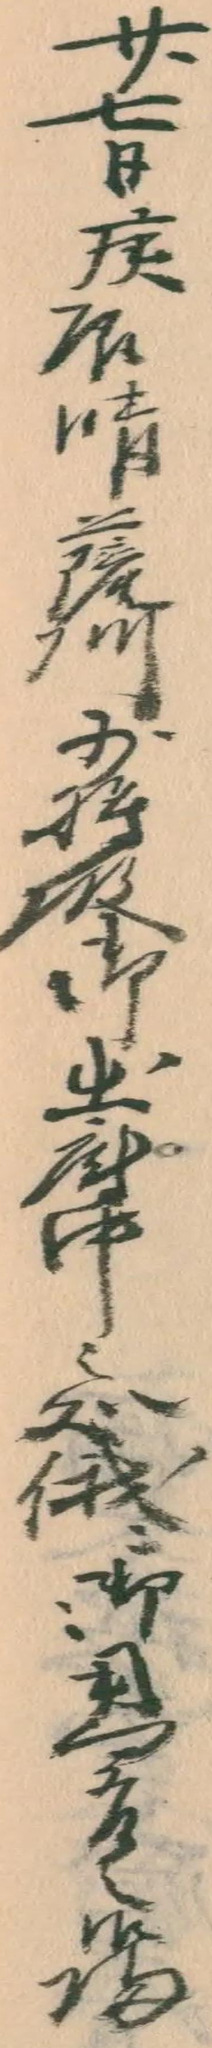廿七日庚辰晴薩州小将殿御出府中之処俄ニ御用向有之御帰
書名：賀茂社記録. 第70冊
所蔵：国立国会図書館 National Diet Library, JAPAN
